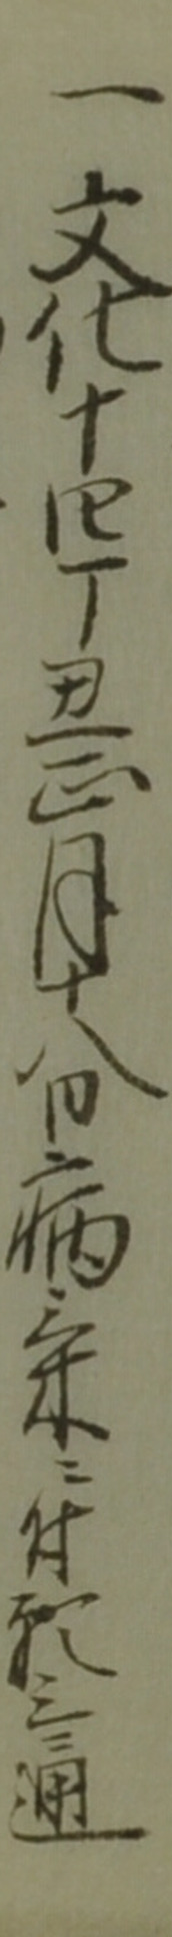一文化十四丁丑正月十八日病気に付願之通
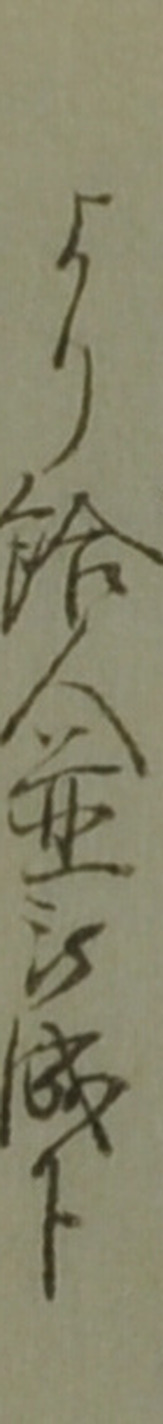より給人並被成下
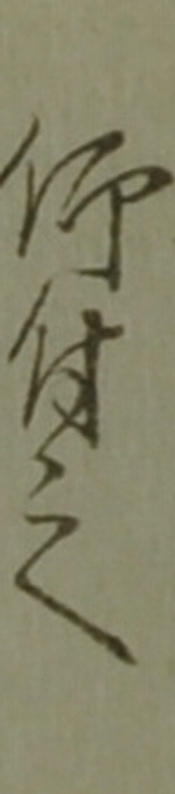仰付之
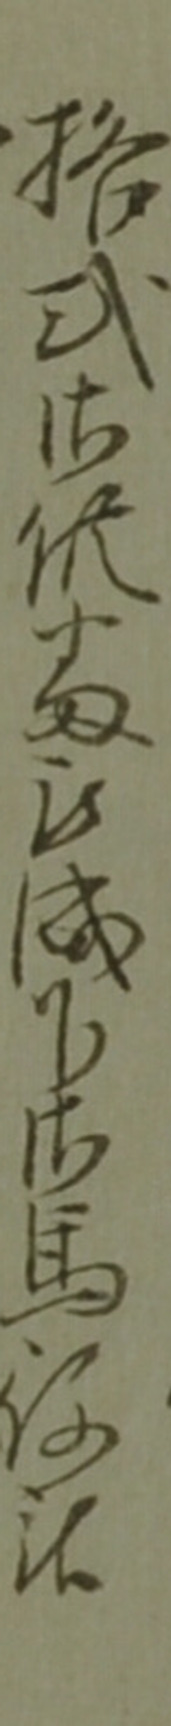格式御供番被成下御馬役被
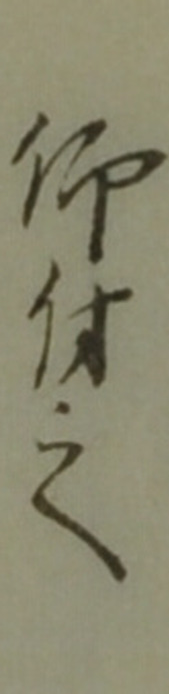仰付之
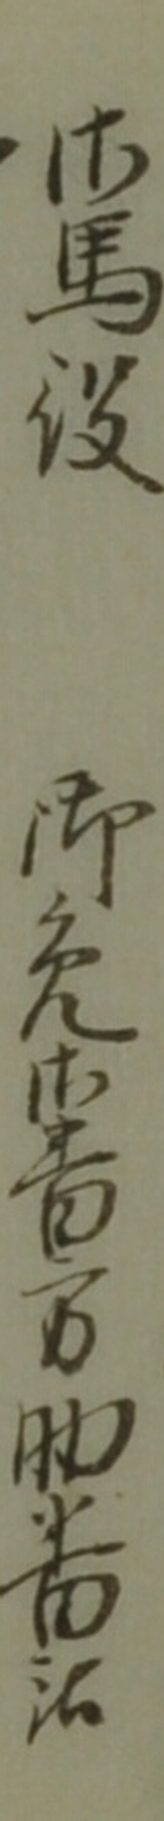御馬役御免御番方助番被

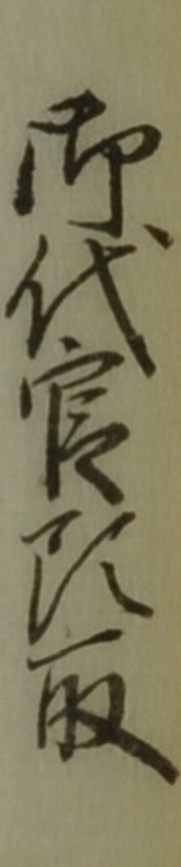御代官頭取
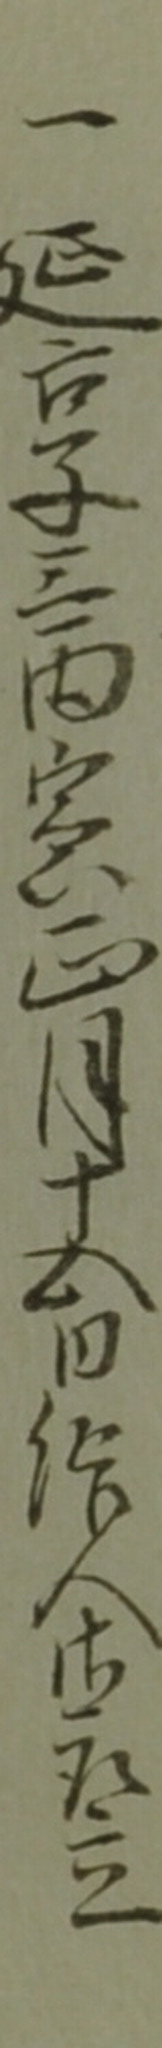一延享三丙寅正月十五日給人御取立
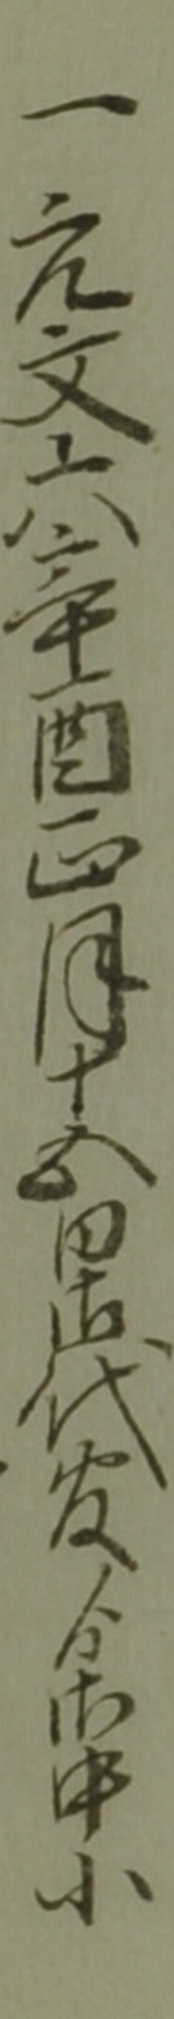一元文六辛酉正月十五日御代官より御中小
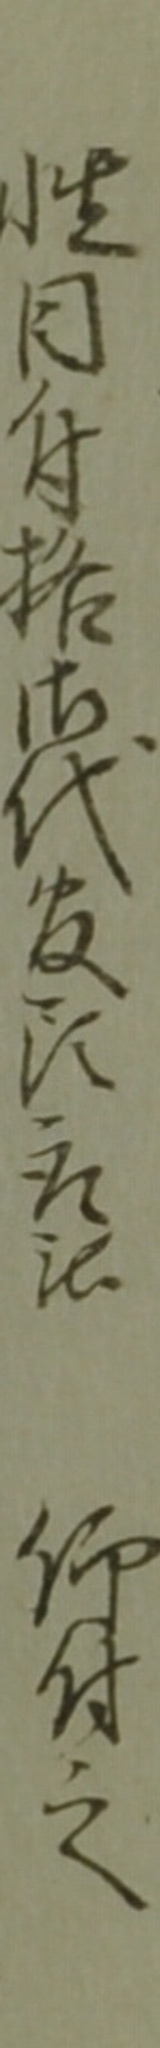性目付格御代官頭取被仰付之
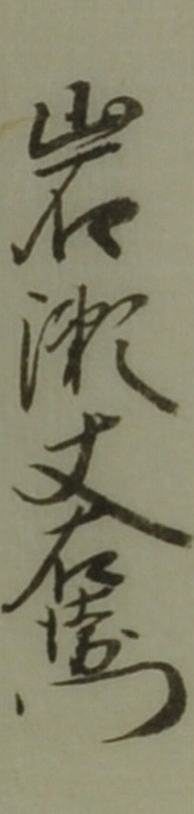岩瀬丈右衛門
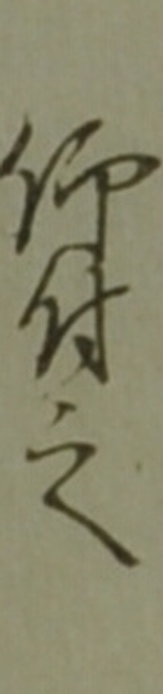仰付之
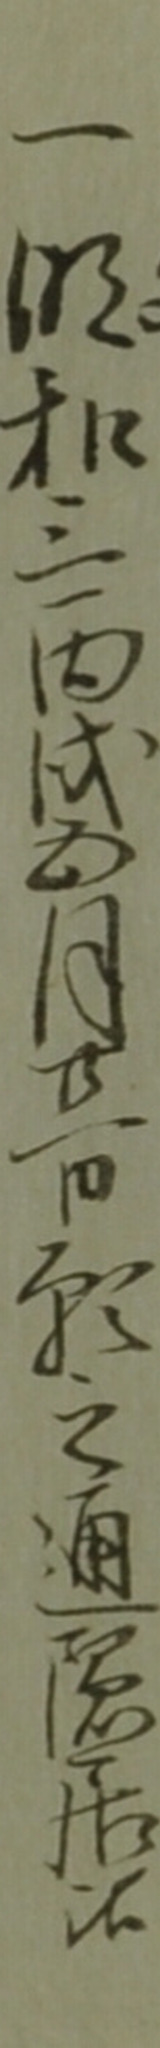一明和三丙戌正月廿一日願之通隠居被
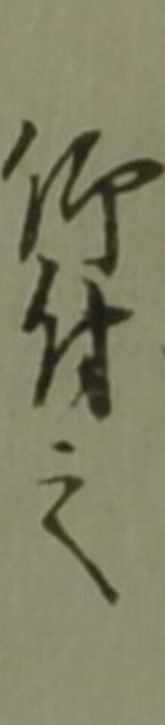仰付之
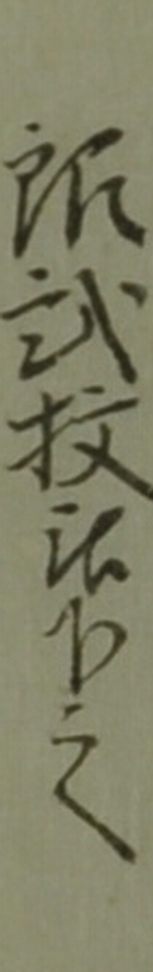銀弐枚被下之
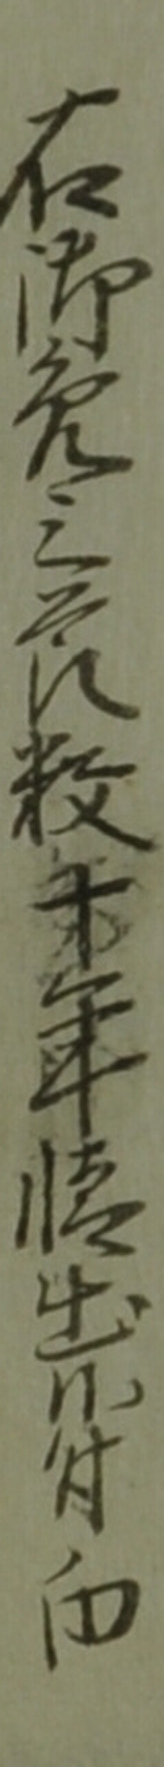右御免之節数十年情出候付白
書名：諸御役代々録（八）
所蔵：伊那市立高遠町図書館・合同会社AMANE
